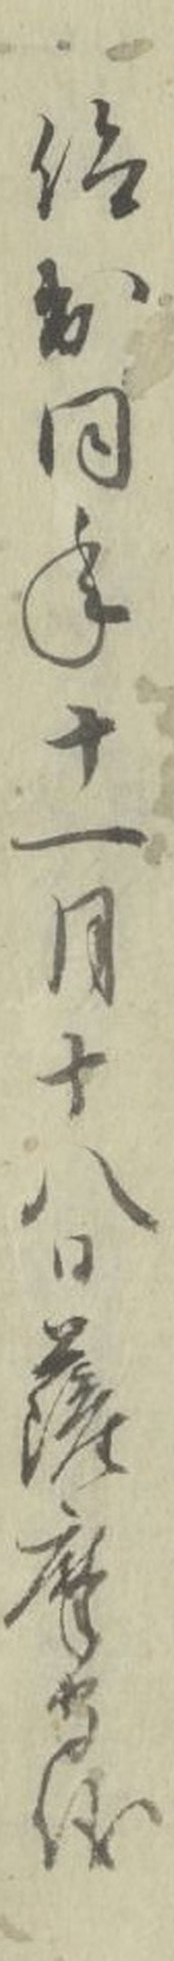仰出同年十一月十八日薩摩守儀

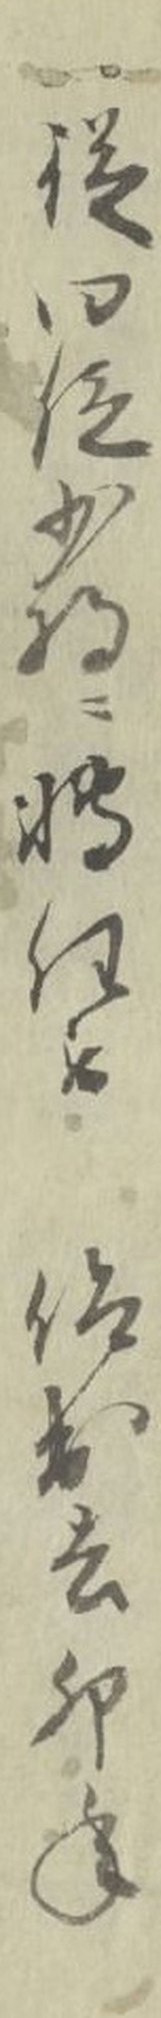従四位少将に転任被仰出去卯年
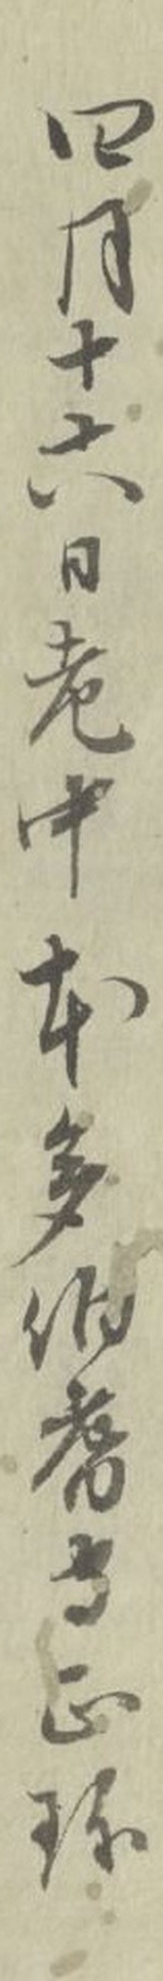四月十六日老中本多伯耆守正珍
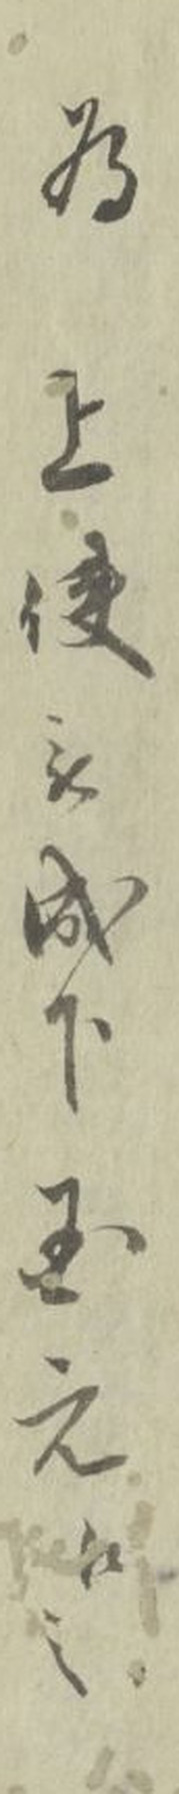為上使被成下国元え之
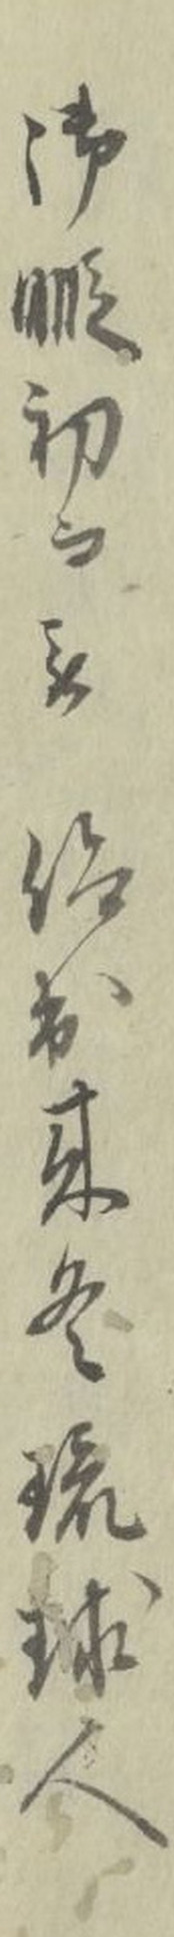御暇初而被仰出来冬琉球人
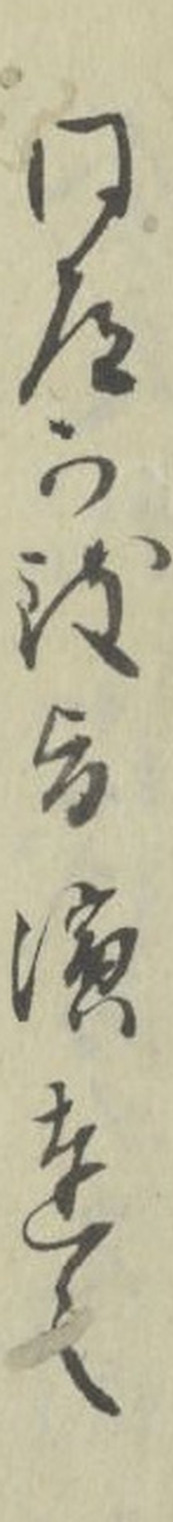同道可致旨演達之
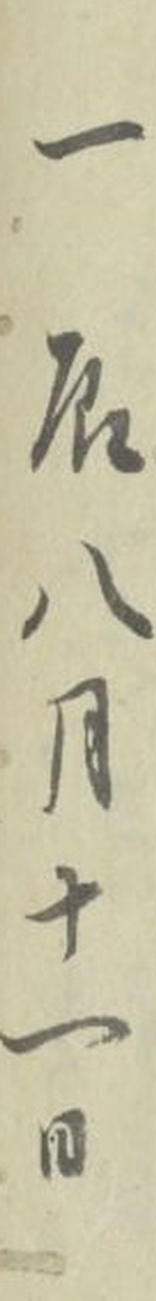一辰八月十一日
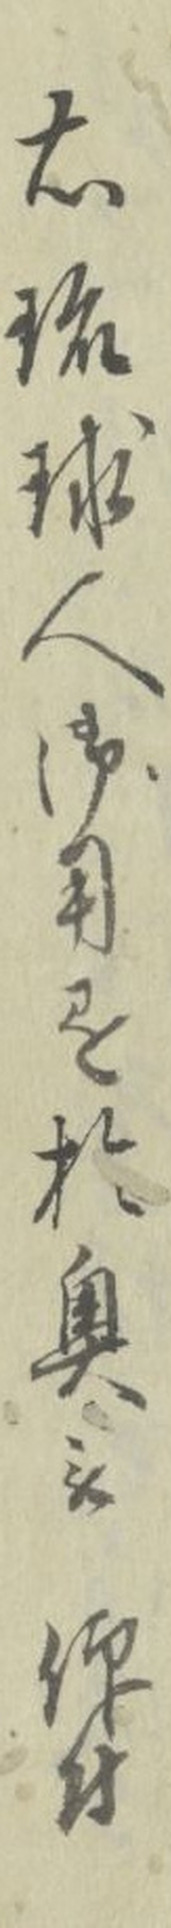右琉球人御用懸於奥被仰付
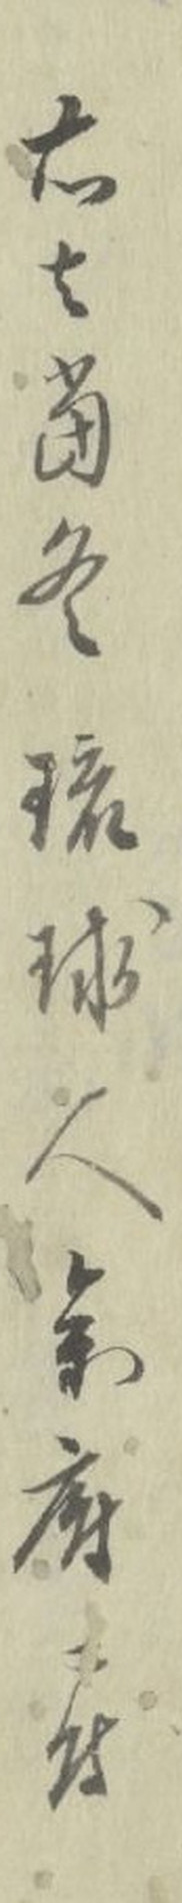右者当冬琉球人参府に付
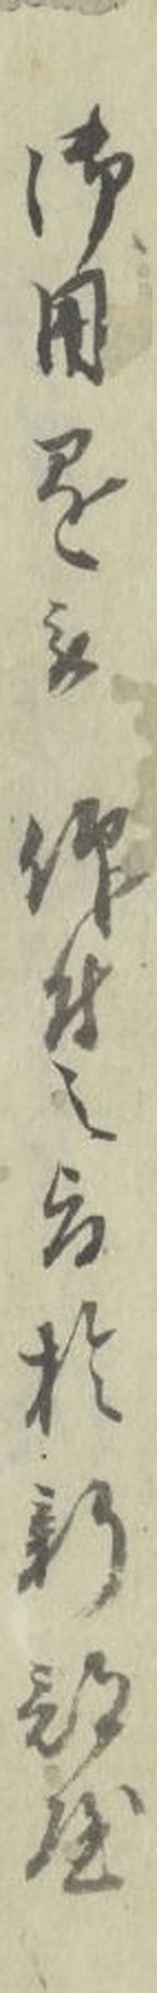御用懸被仰付之旨於新部屋

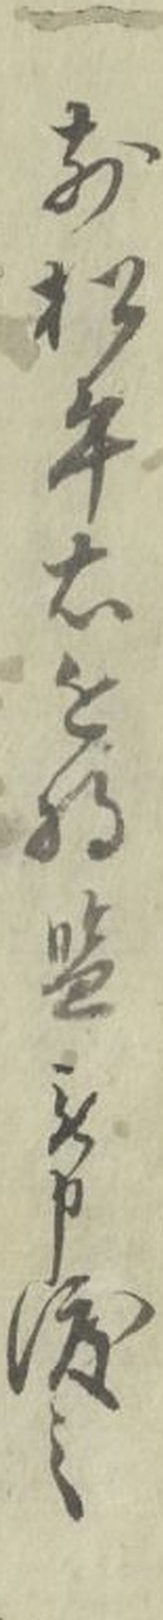前松平右近将監被申渡之
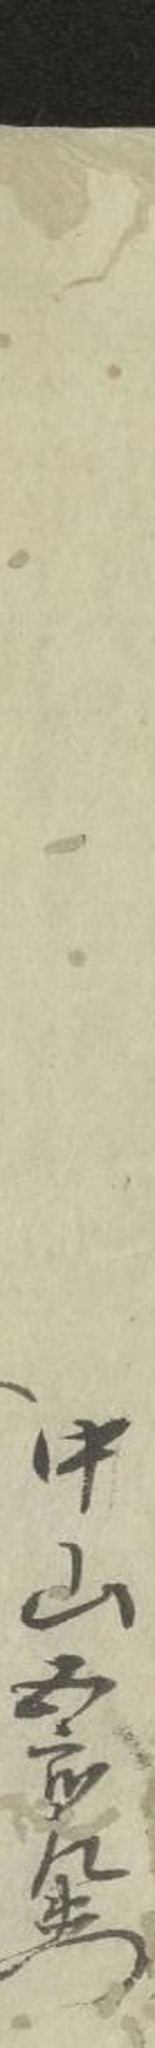中山五郎左衛門
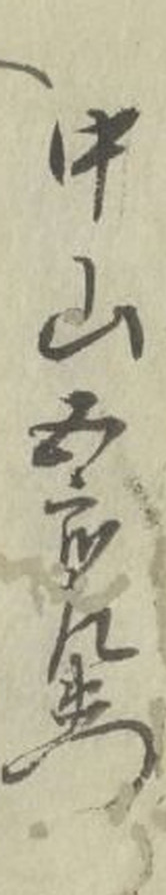中山五郎左衛門
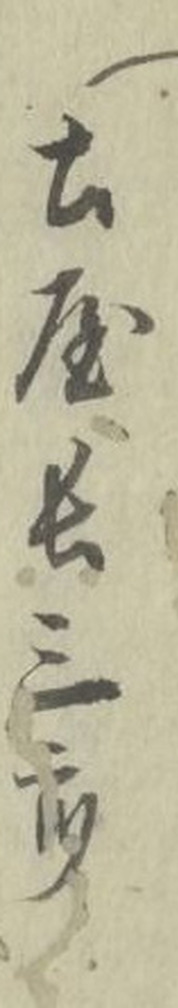土屋長三郎
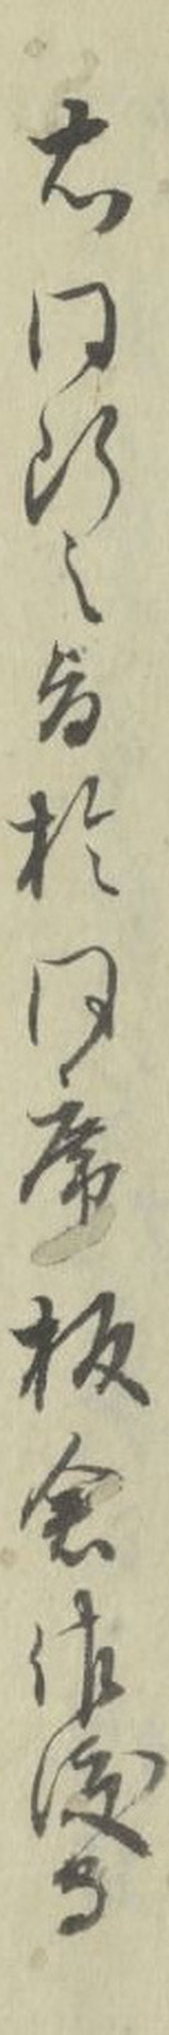右同断之旨於同席板倉佐渡守
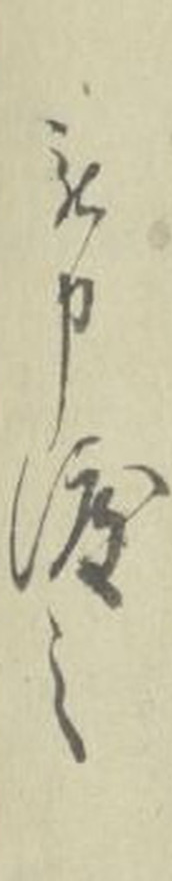被申渡之
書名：琉球来朝記 自一至七
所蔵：University of the Ryukyus Library
